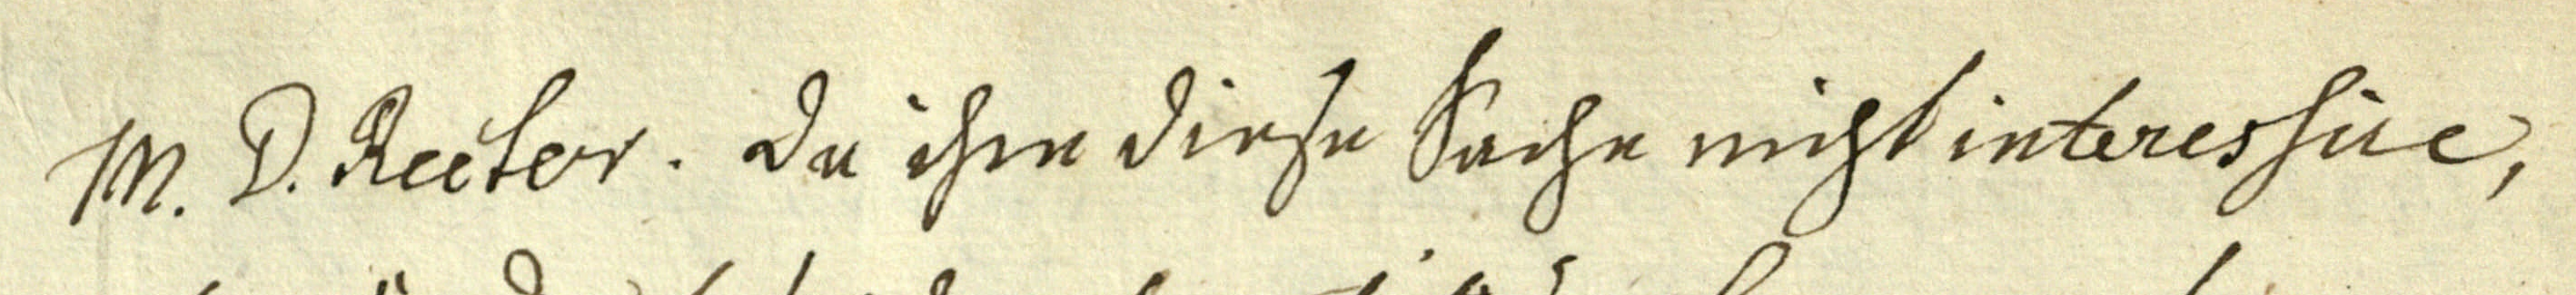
M. D. Rector. Da ihre diese Sache nicht interessire,
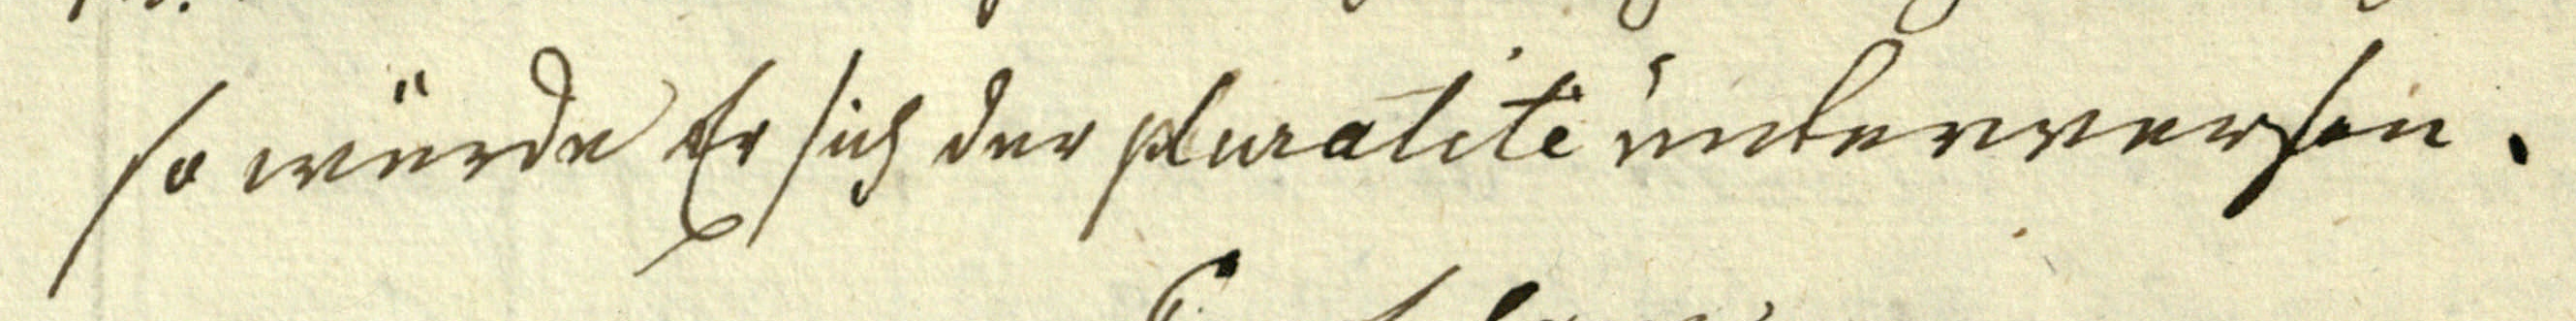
so würde Er sich der pluralite unterwerfen.
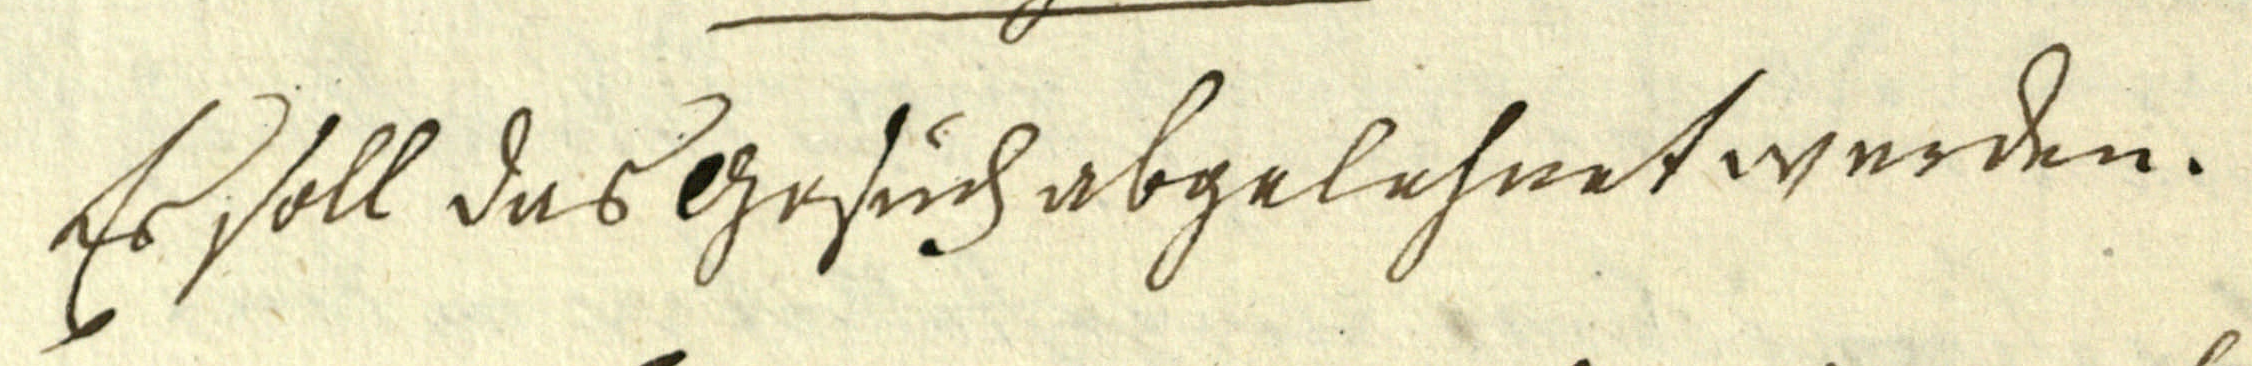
Es soll das Gesuch abgelehnet werden.
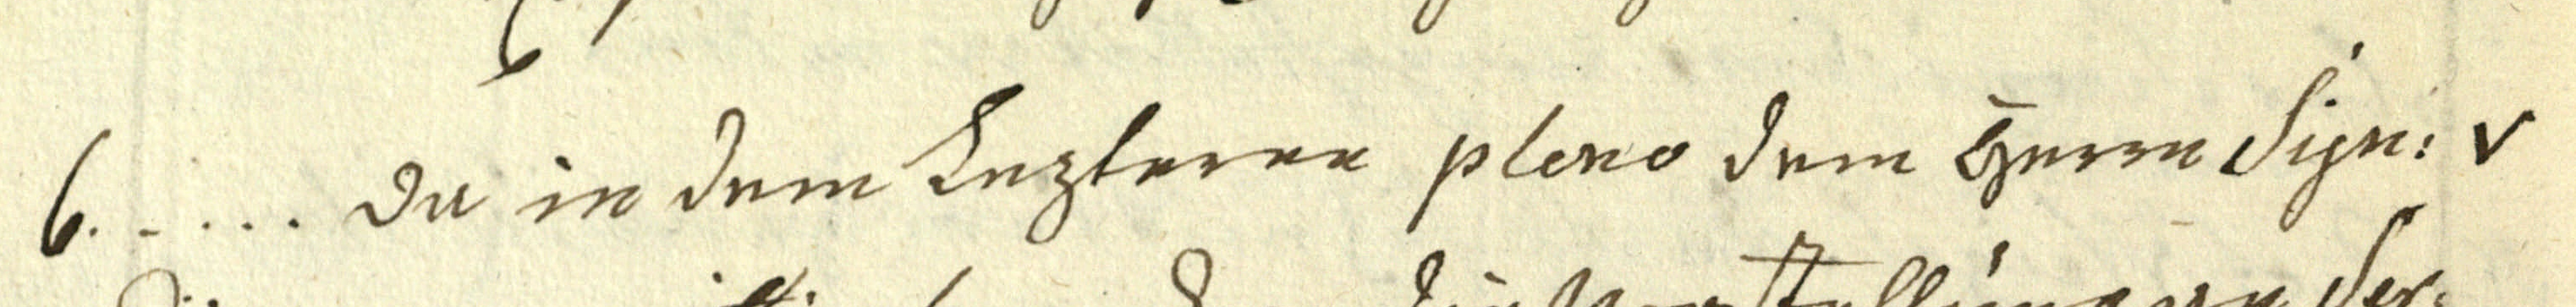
6. Da in dem Lezteren pleno dem Herrn Sÿn¬
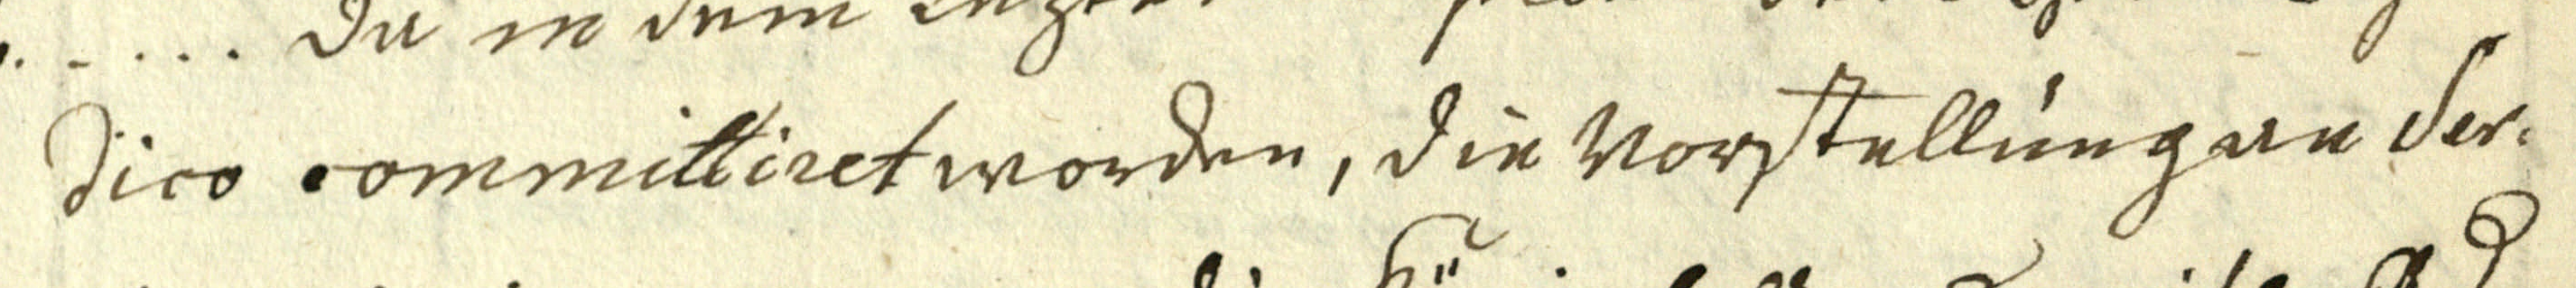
dico committiret worden, die Vorstellung an Ser¬
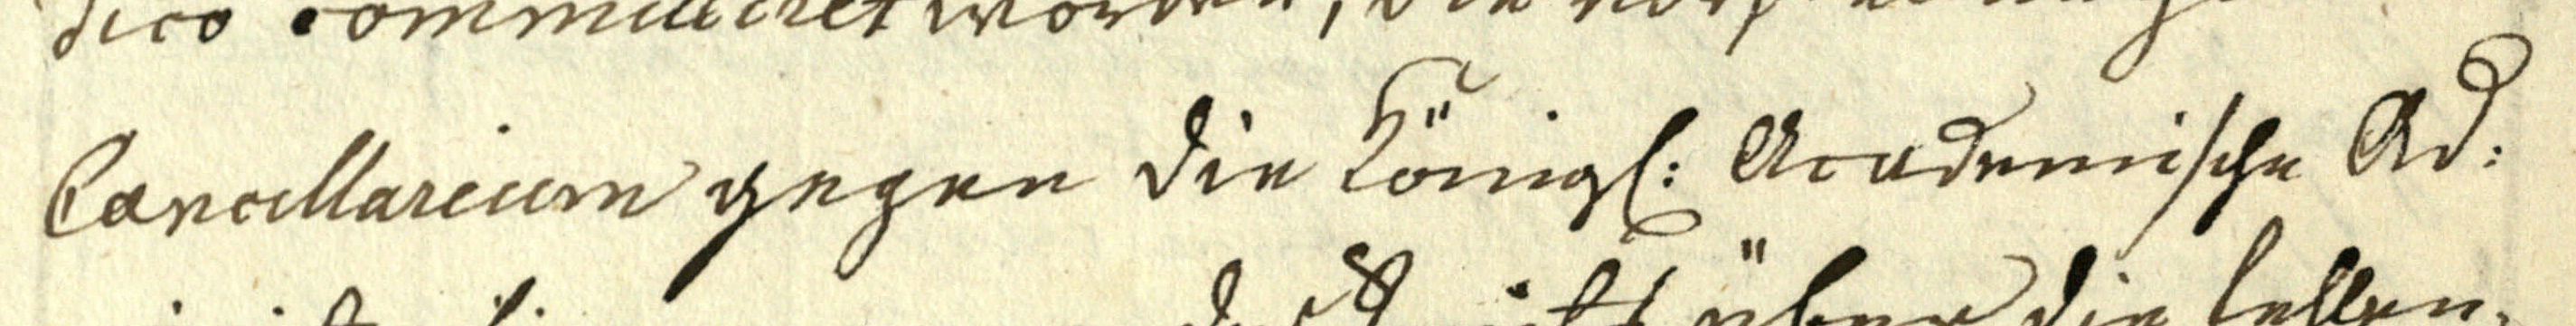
Cancellarium gegen die Königl. Academische Ad¬
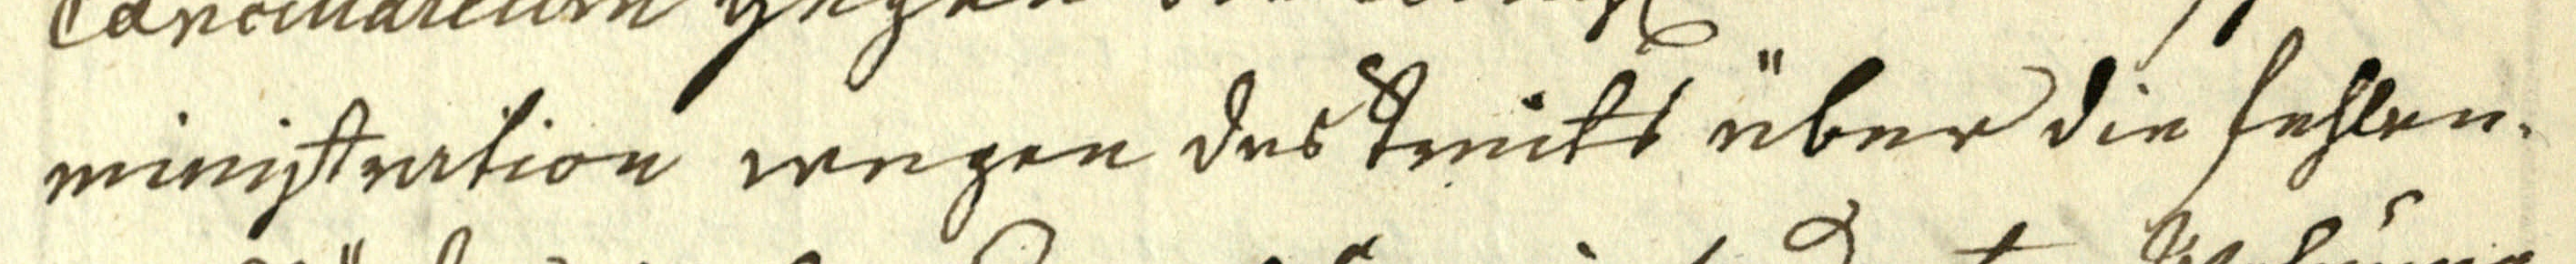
ministration wegen des Sreits über die fehlen¬
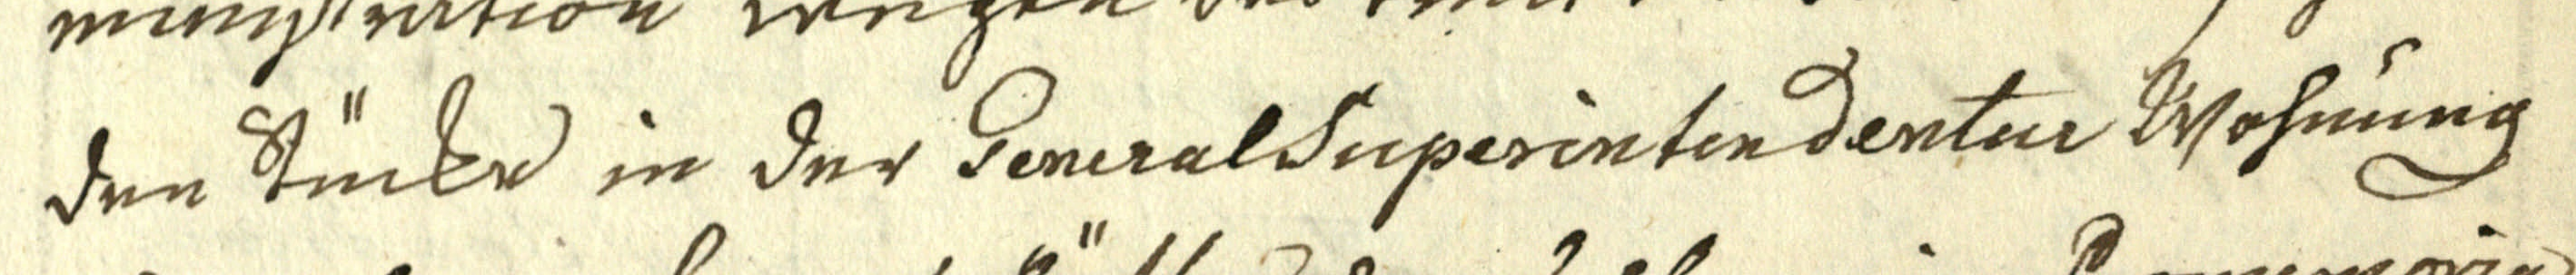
den Stücke in der GeneralSuperintendentur Wohnung
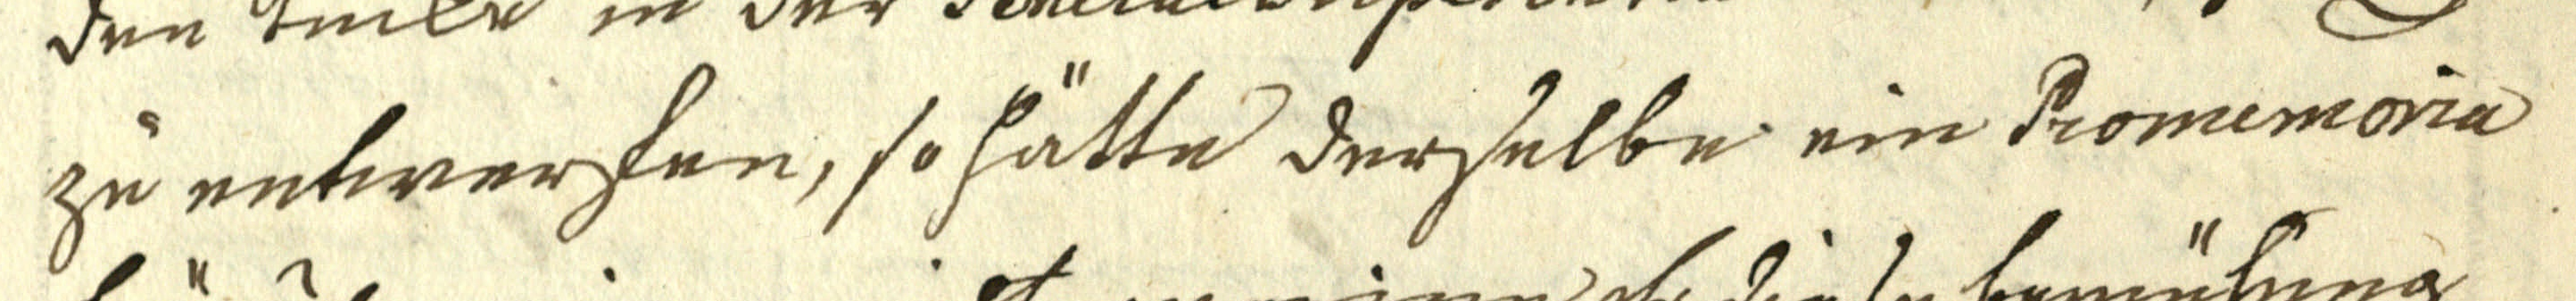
zu entwerfen, so hätte derselbe ein Promemoria
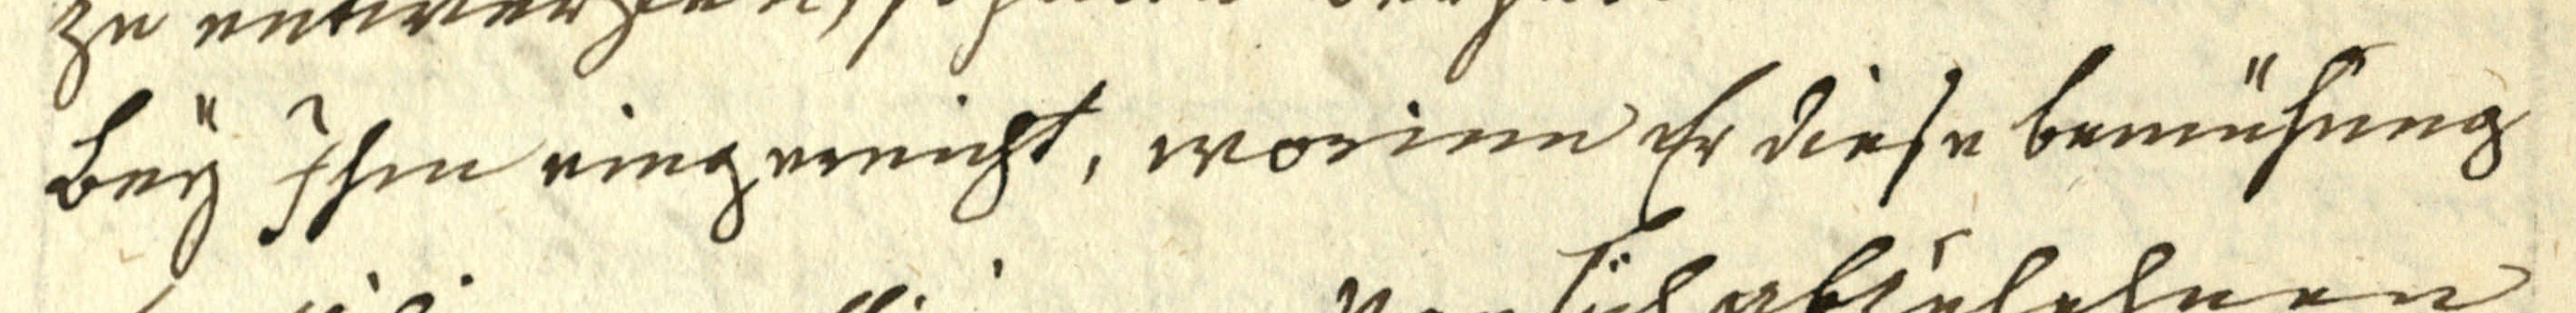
beÿ Ihm eingereicht, worin Er diese Bemühung
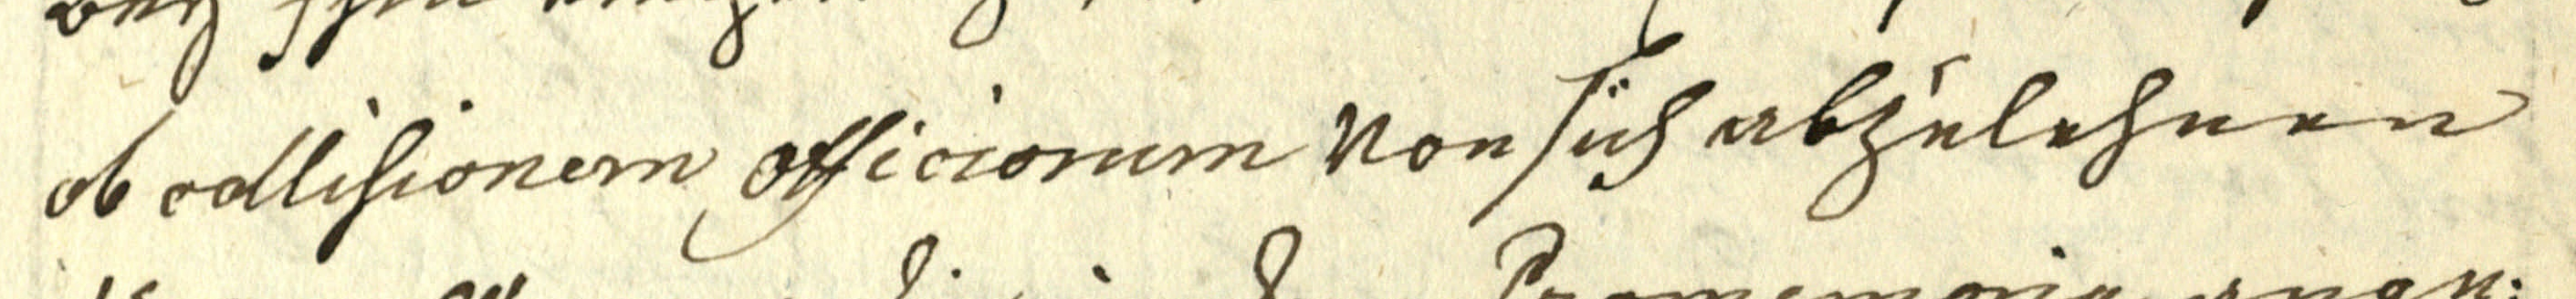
ob collisionem officiorum von sich abzulehnen
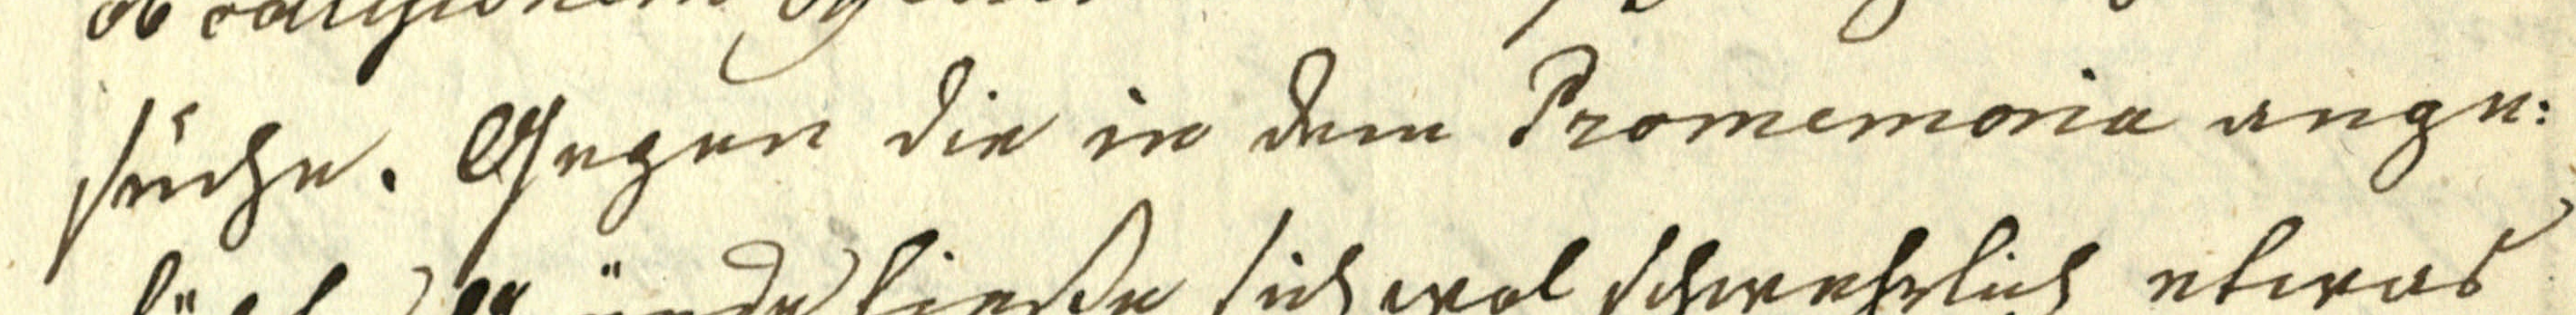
suche. Gegen die in dem Promemoria ange¬
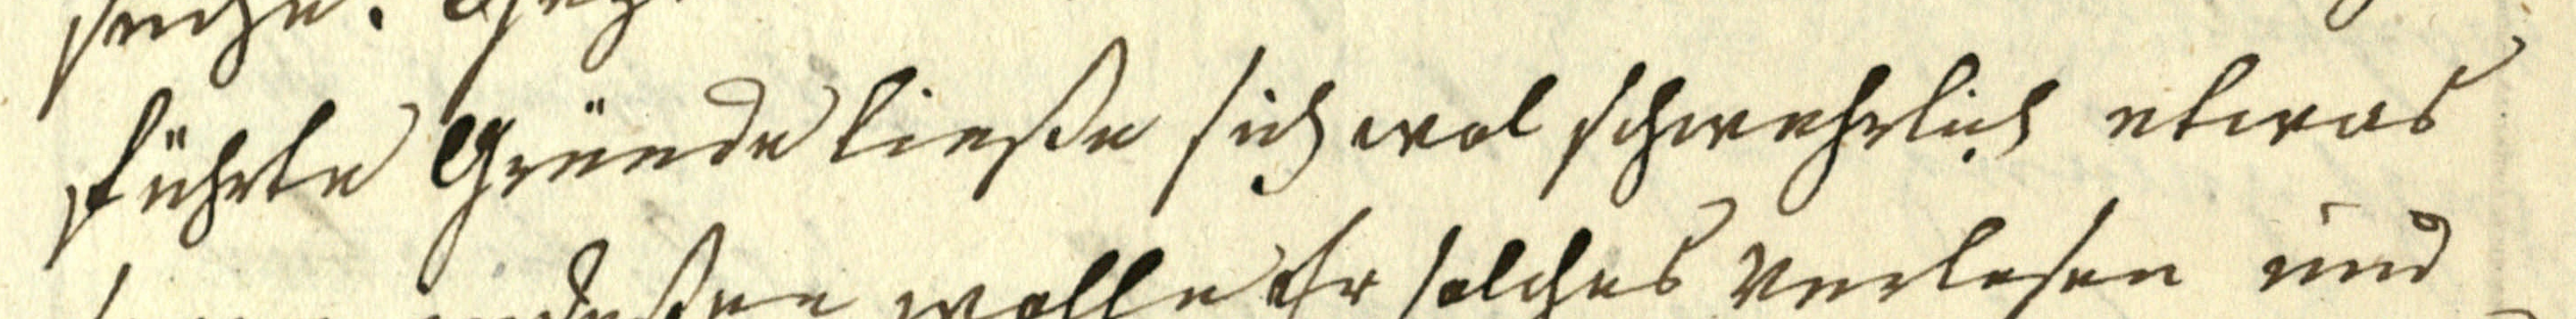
führte Gründe ließe sich wol schwehrlich etwas
